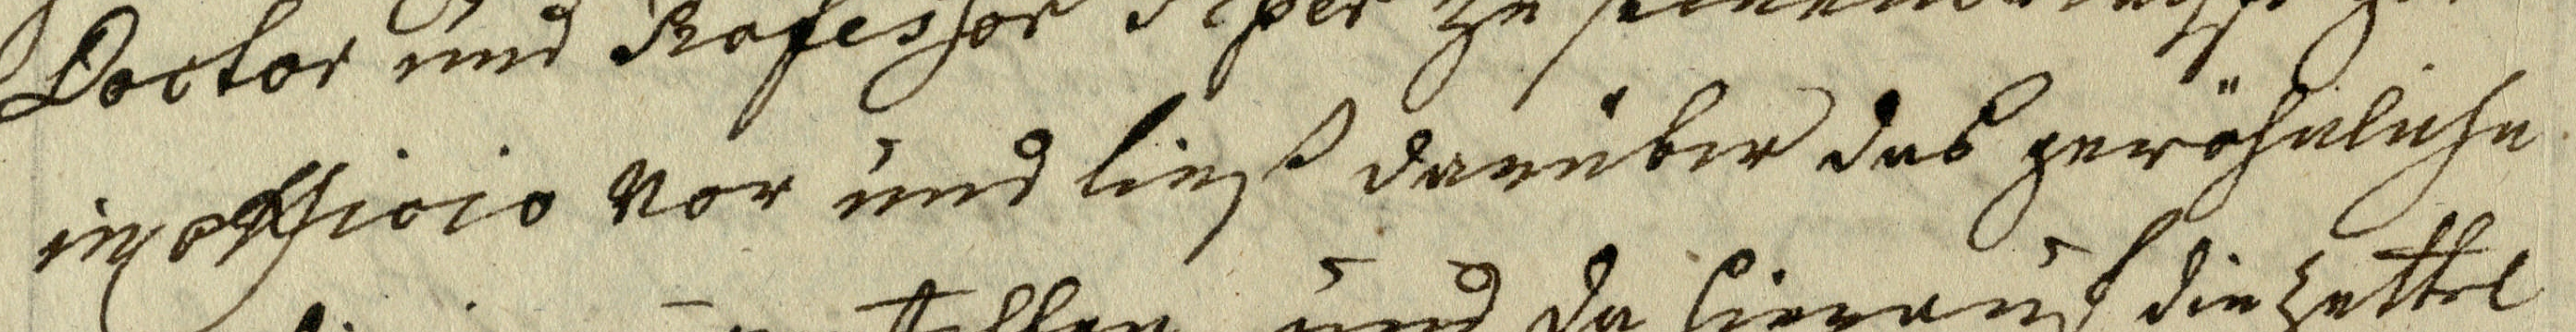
in officio vor und ließ darüber das gewöhnliche
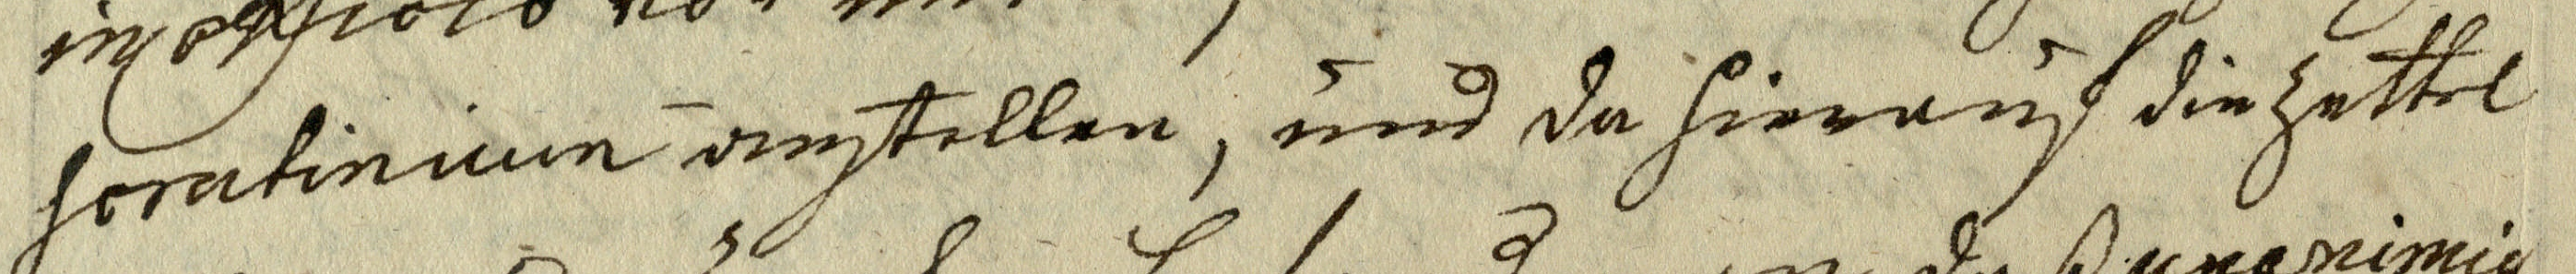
scratinium anstellen, und da hierauf die Zettel
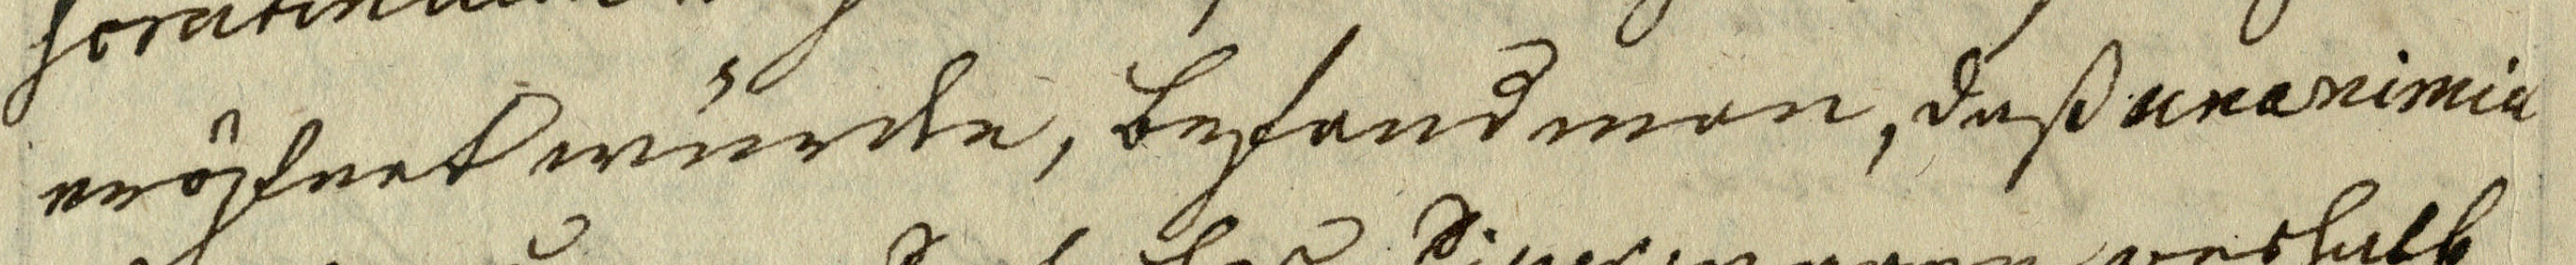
eröfnet wurden, befand man, daß unanimia
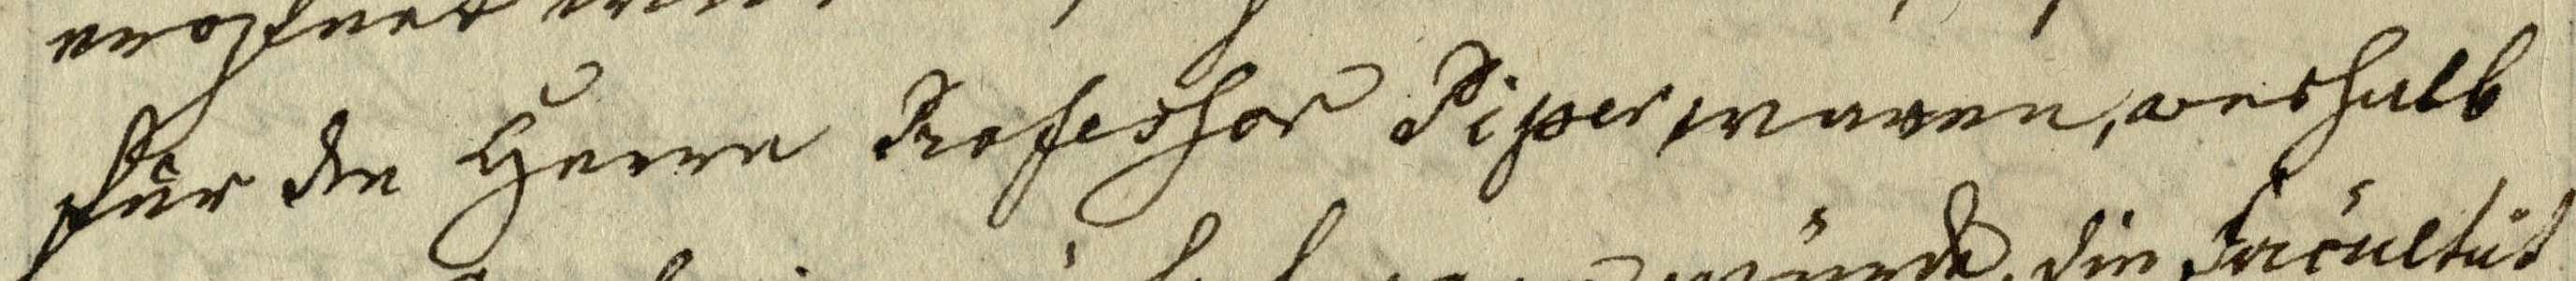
für den Herrn Professor Piper waren, weshalb
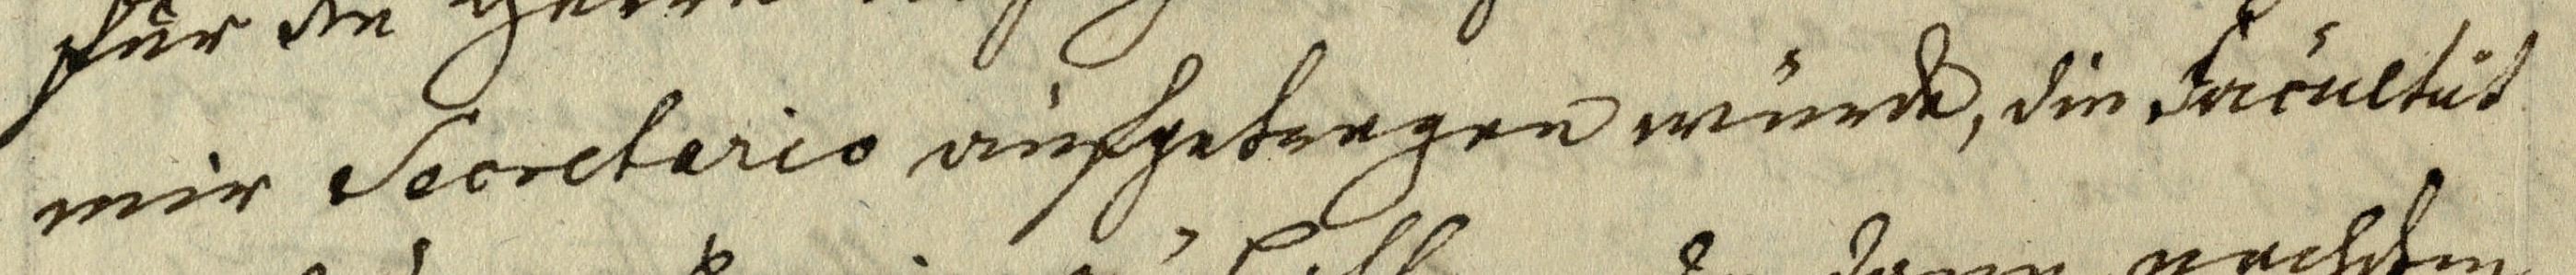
mir Secretario aufgetragen wurde, die Facultät
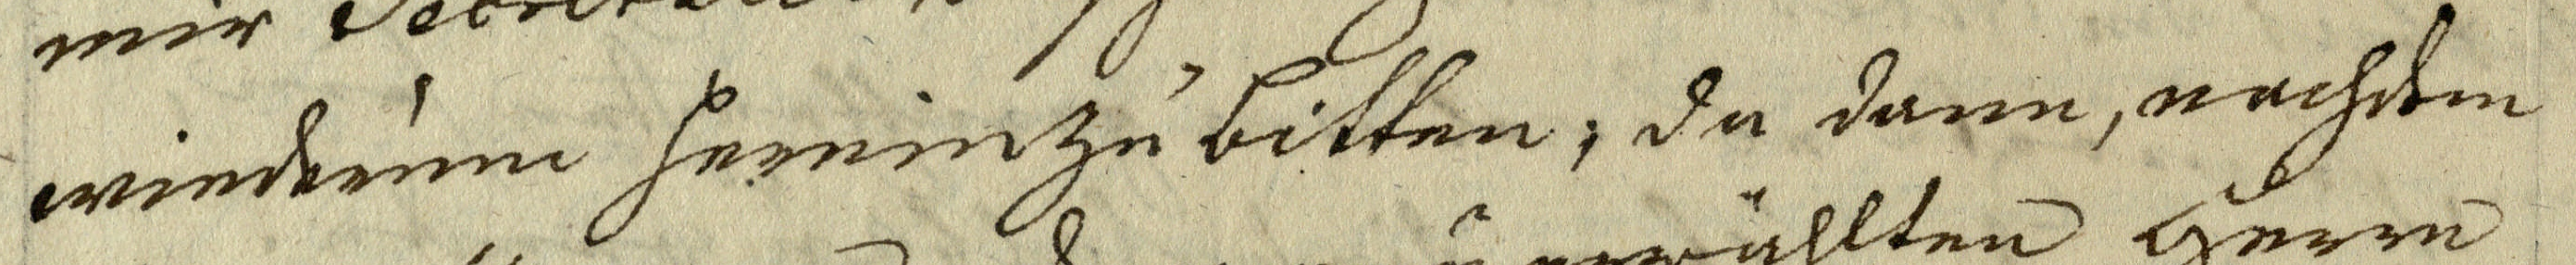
wiederum hereinzu bitten, da dann, nachdem
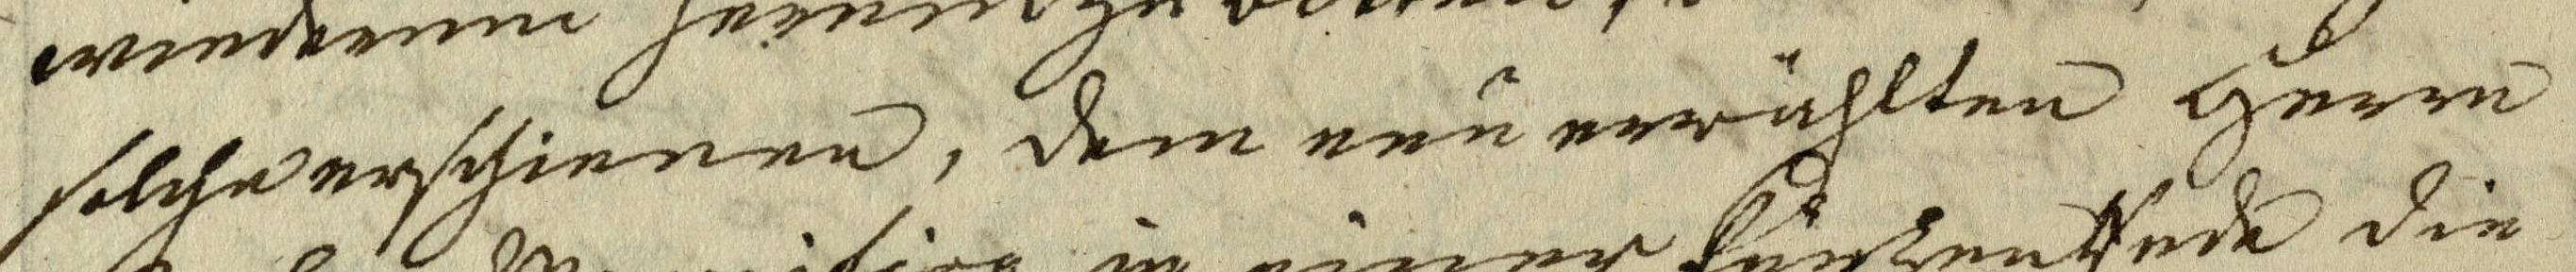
solche erschienen, dem neu erwählten Herrn
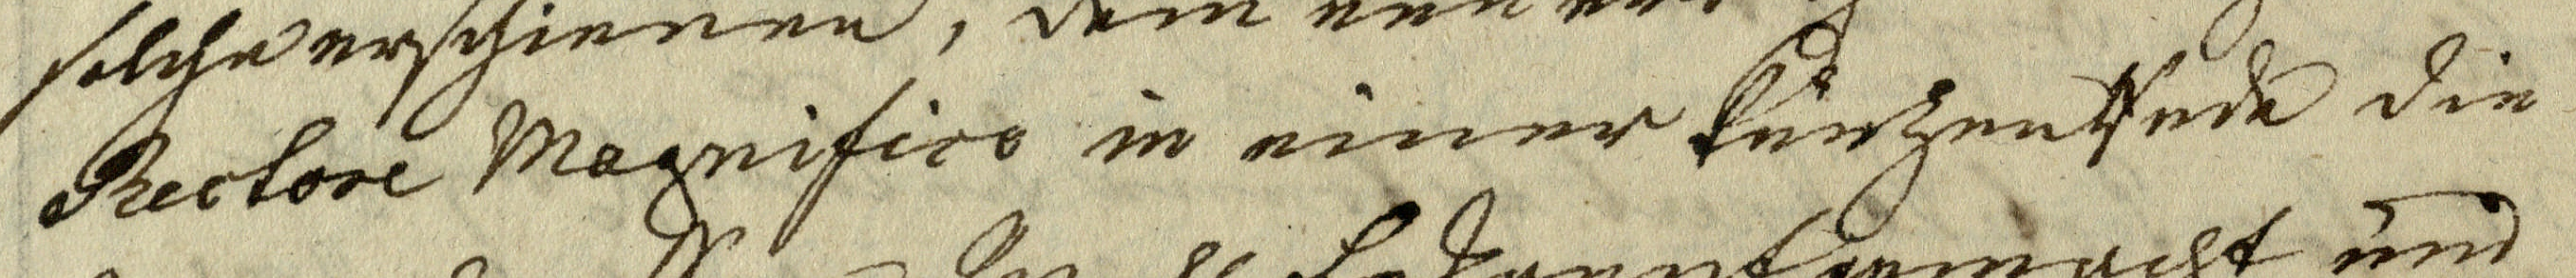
Rectore Magnifico in einer kurzen Rede die
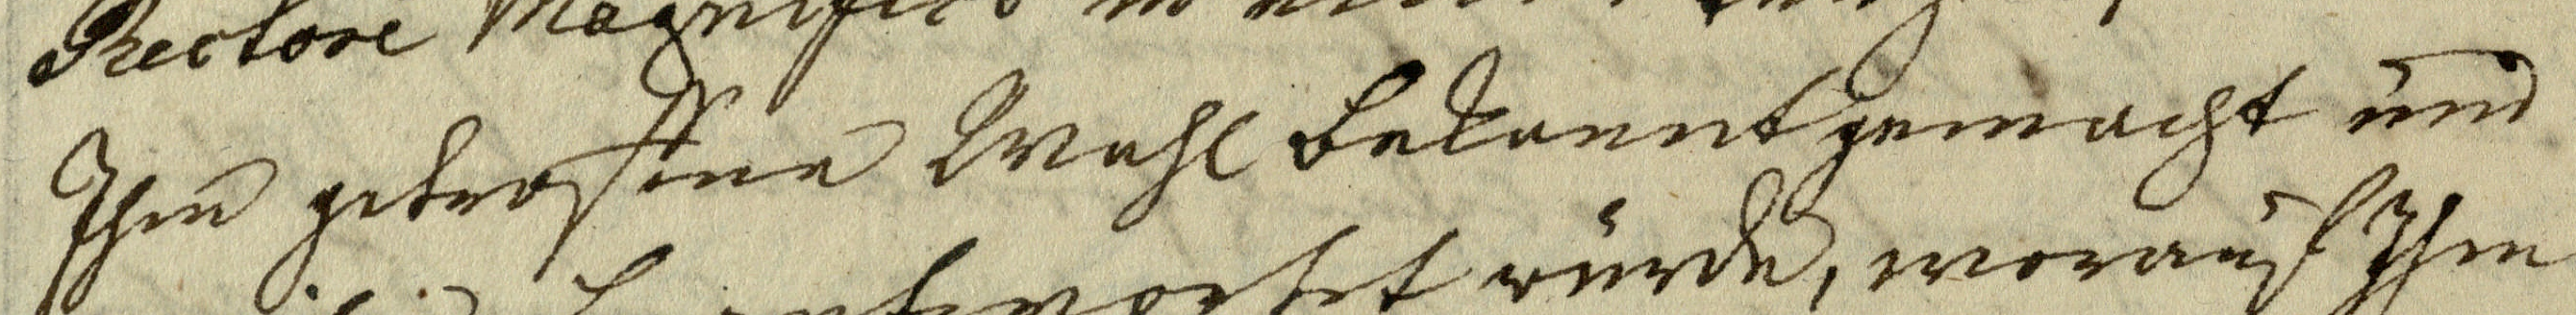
Ihm getroffene Wahl bekannt gemacht und
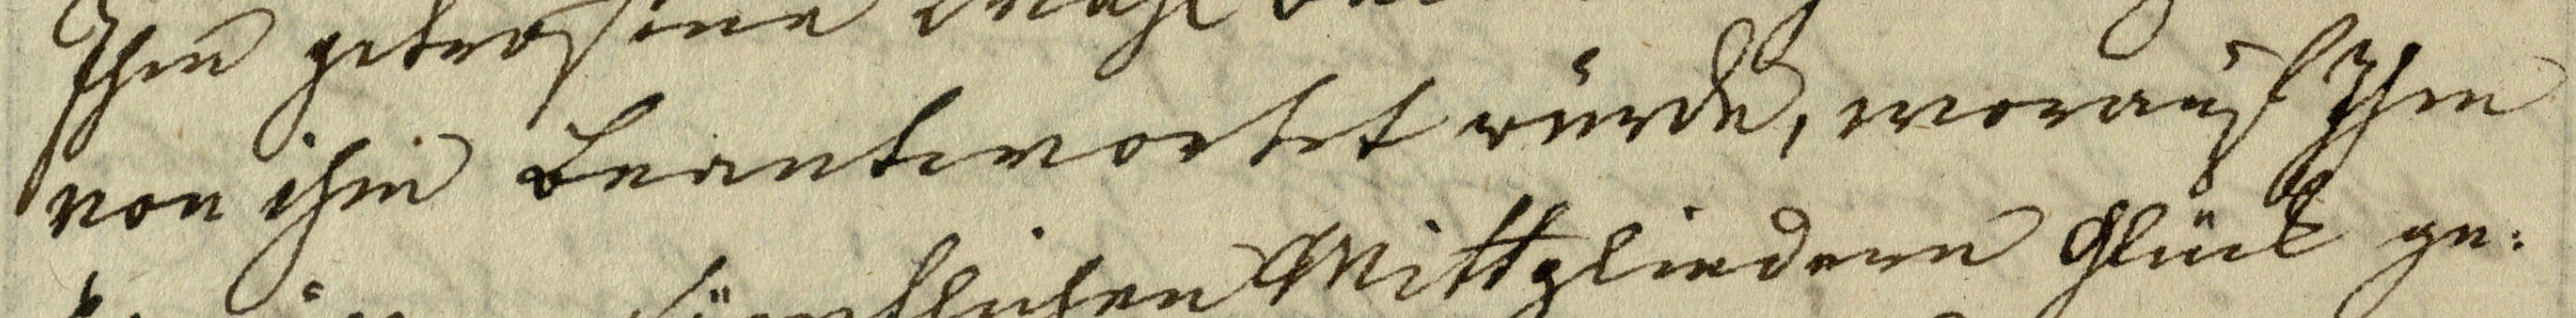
von ihm beantwortet wurde, worauf Ihm
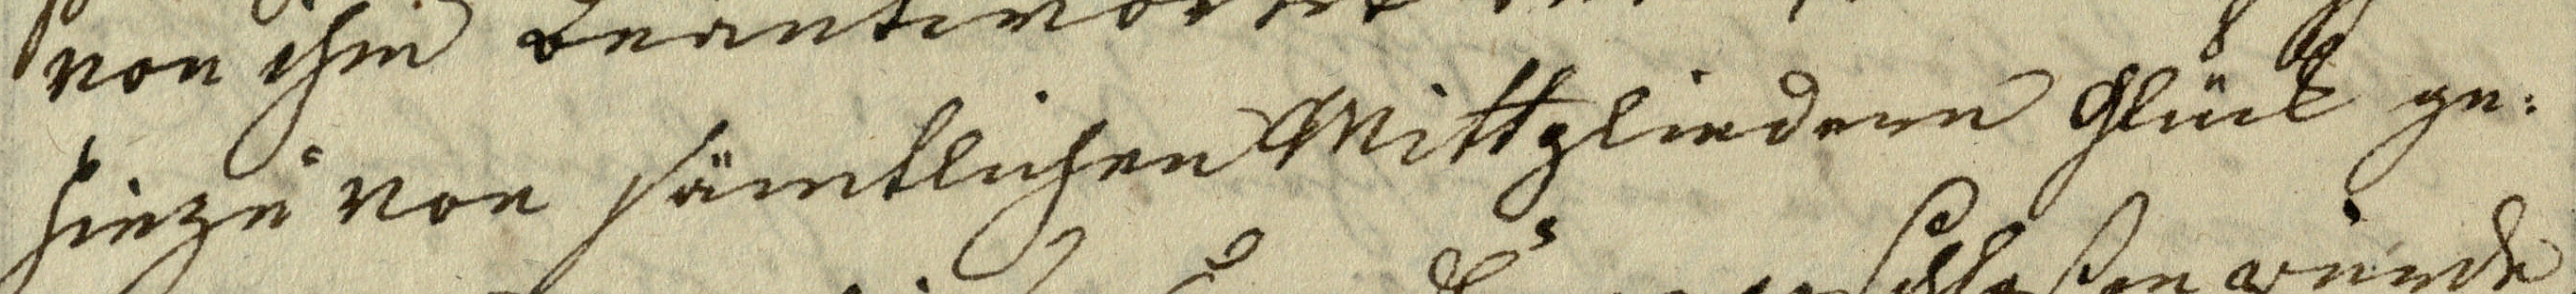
hiezu von sämtlichen Mittgliedern Glück ge¬
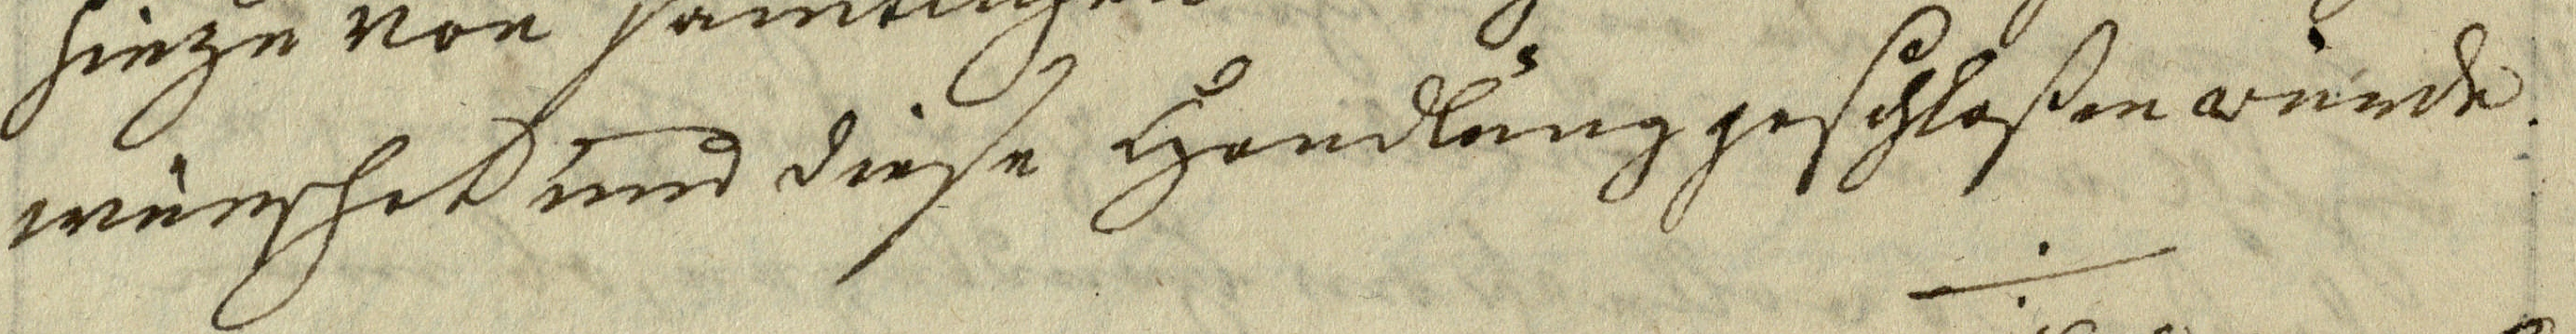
wünschet und diese Handlung geschloßen wurde.
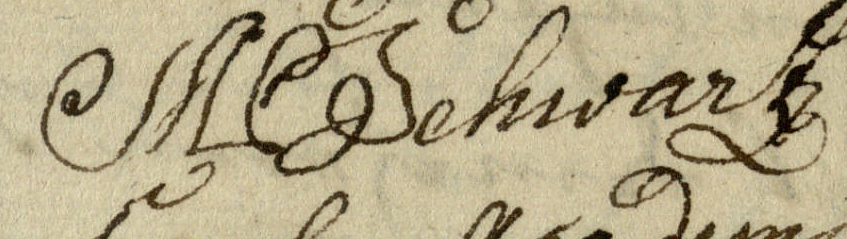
M. C. Schwartz
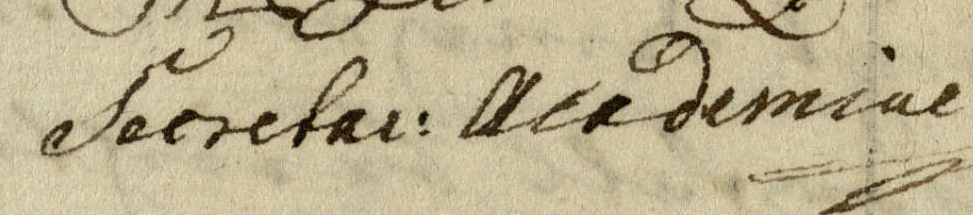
Secretar. Academiae
